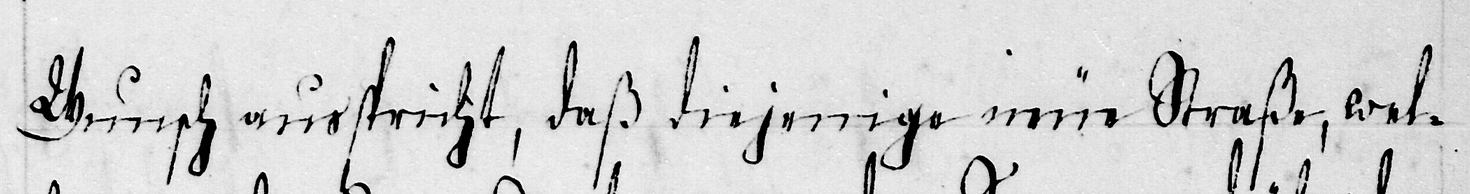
Wunsch ausspricht, daß diejenige neue Straße, wel¬
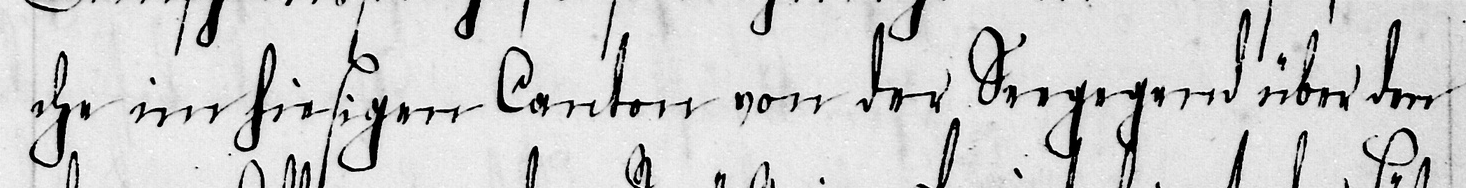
che im hiesigen Canton von der Seegegend über den
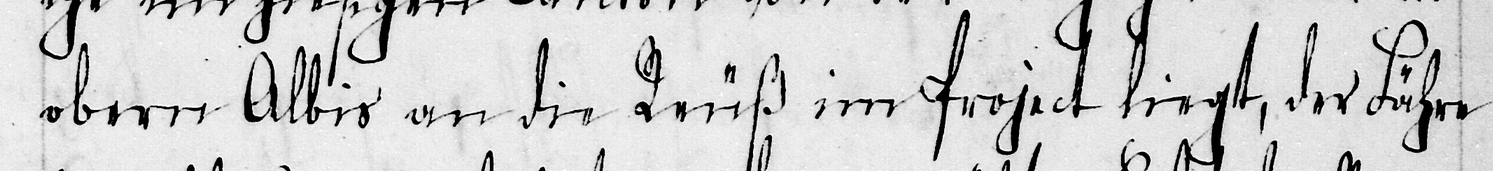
obern Albis an die Reuß im Project liegt, der Fähre
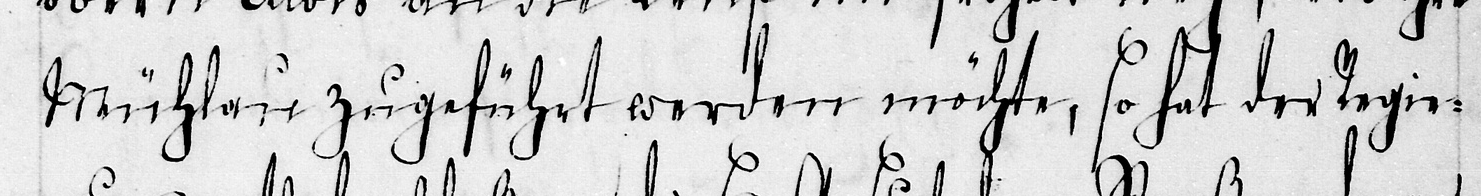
Mühlau zugeführt werden möchte, so hat der Regie¬
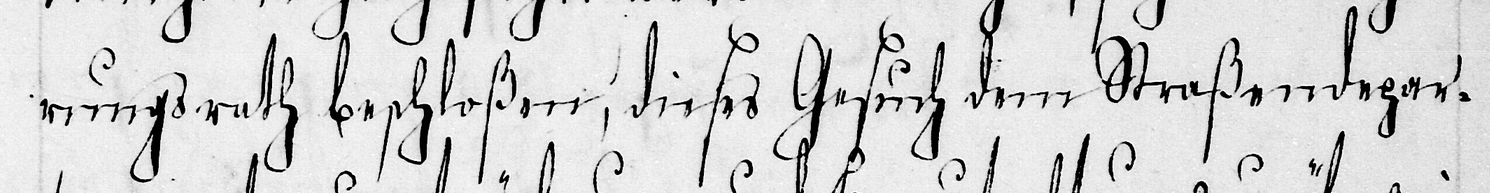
rungsrath beschloßen, dieses Gesuch dem Straßendepar¬
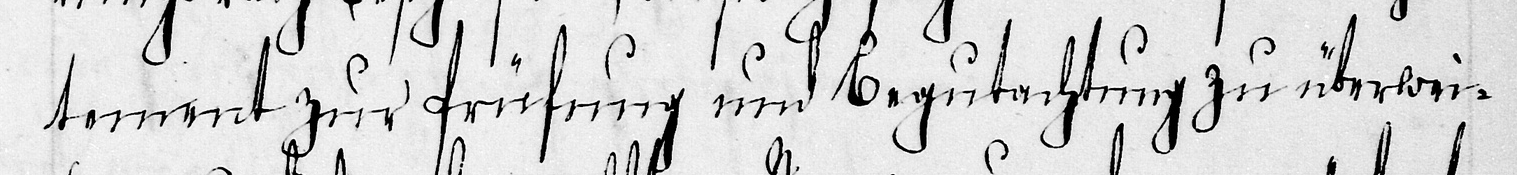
tement zur Prüfung und Begutachtung zu überwei¬
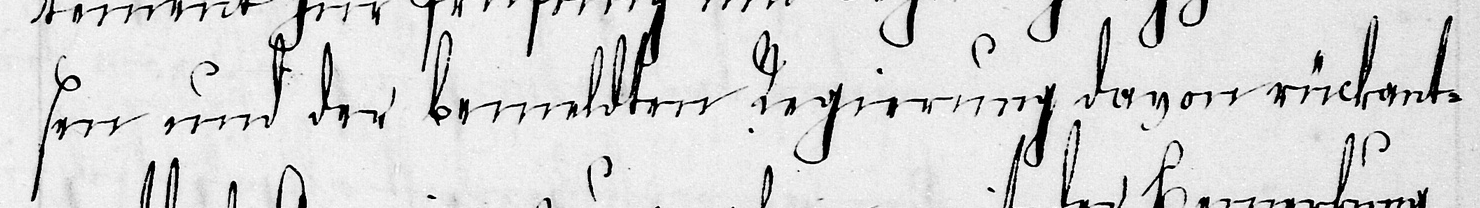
sen und der bemeldten Regierung davon rückant¬
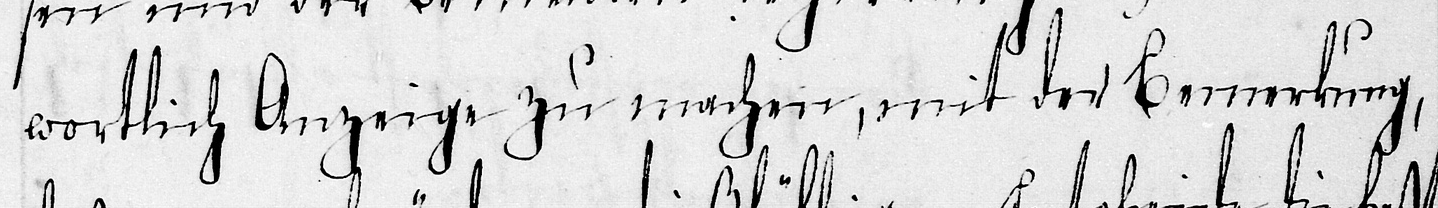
wortlich Anzeige zu machen, mit der Bemerkung,
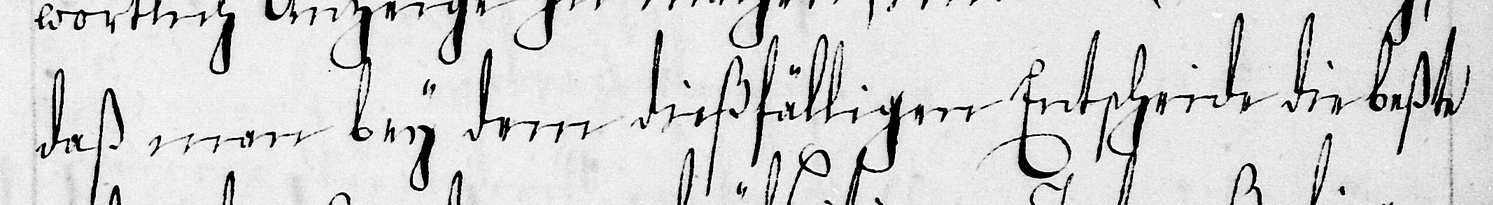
daß man bey dem dießfälligen Entscheide die beßte
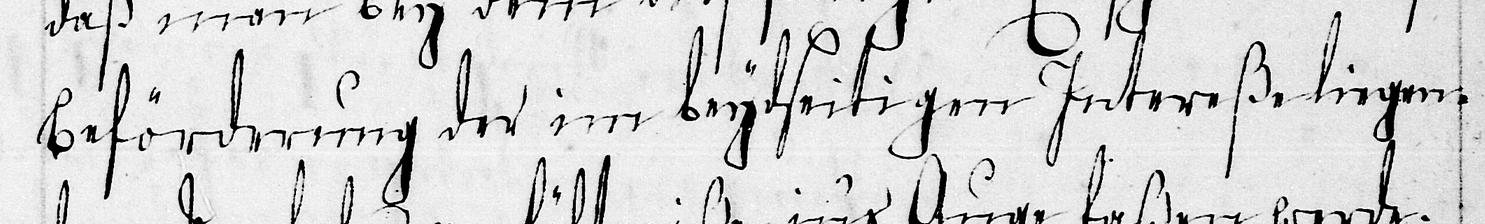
Beförderung der im beydseitigen Intereße liegen¬
